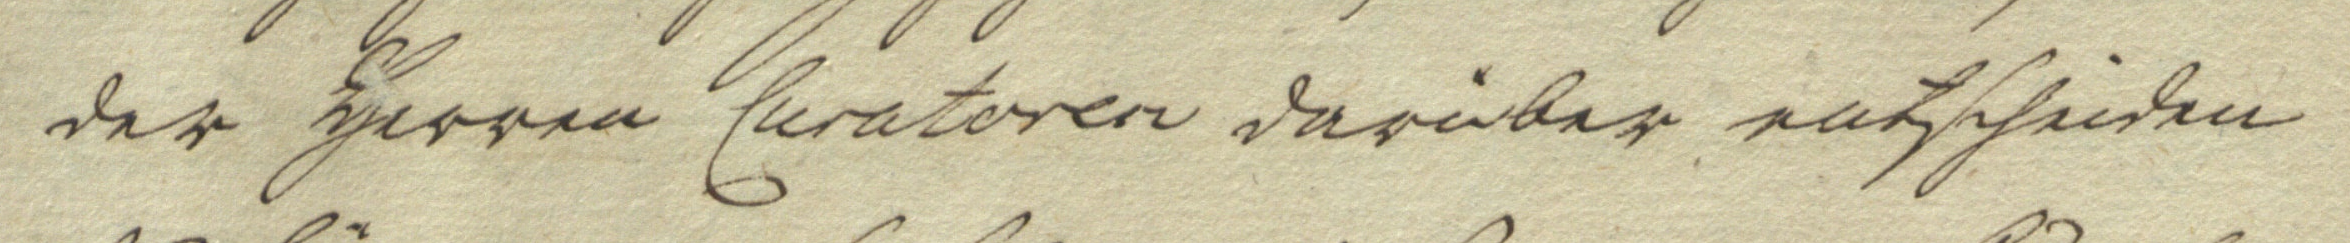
der Herren Curatoren darüber entscheiden
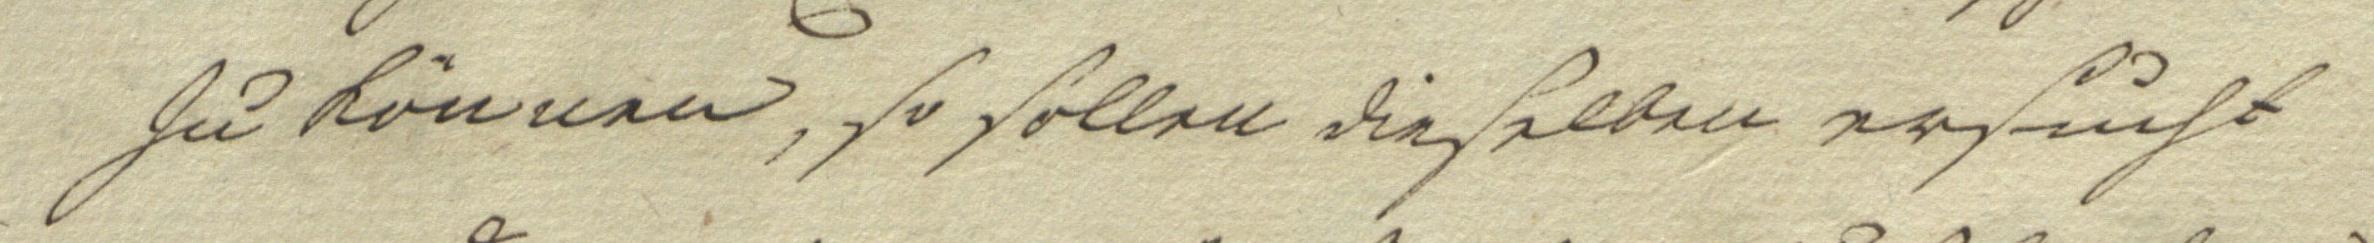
zu können, so sollen dieselben ersucht
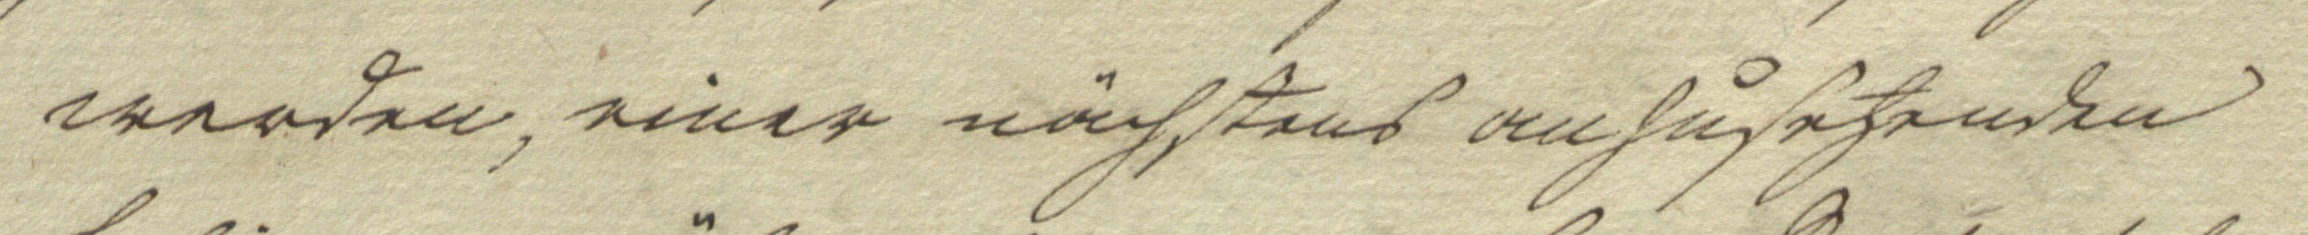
werden, einer nächstens anzusetzenden
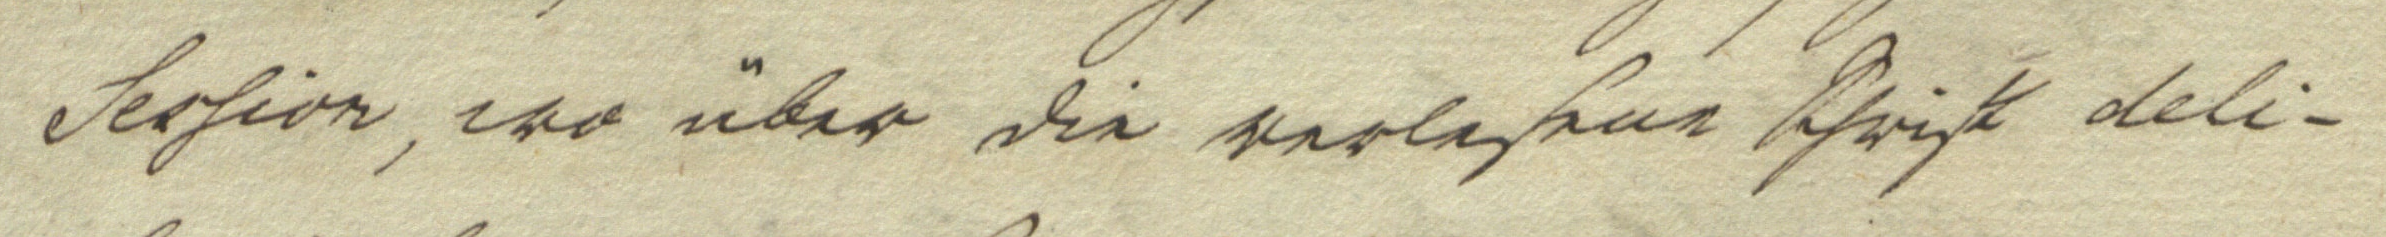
Session, wo über die verlesene Schrift deli¬
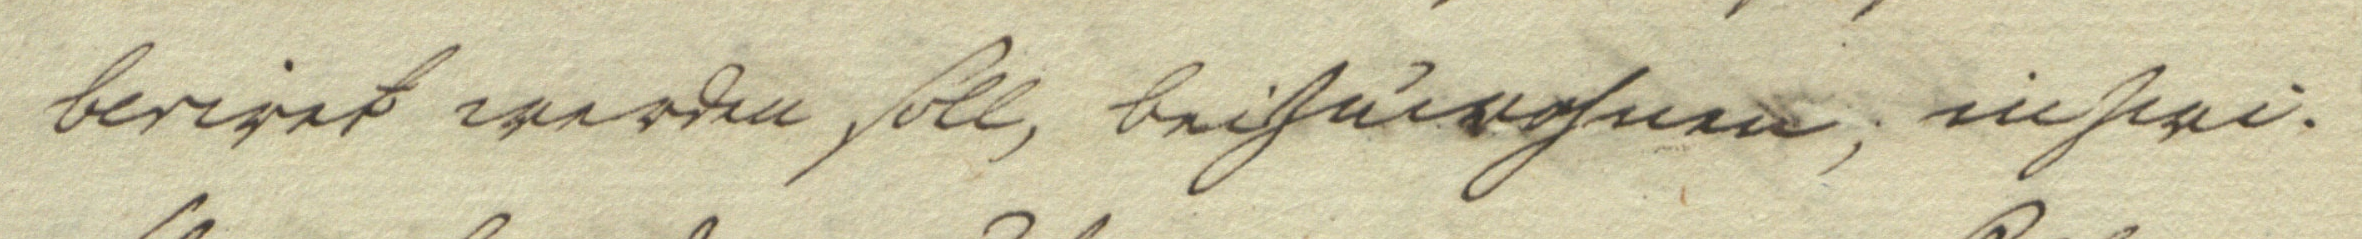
beriret werden soll, beizuwohnen; inzwi¬
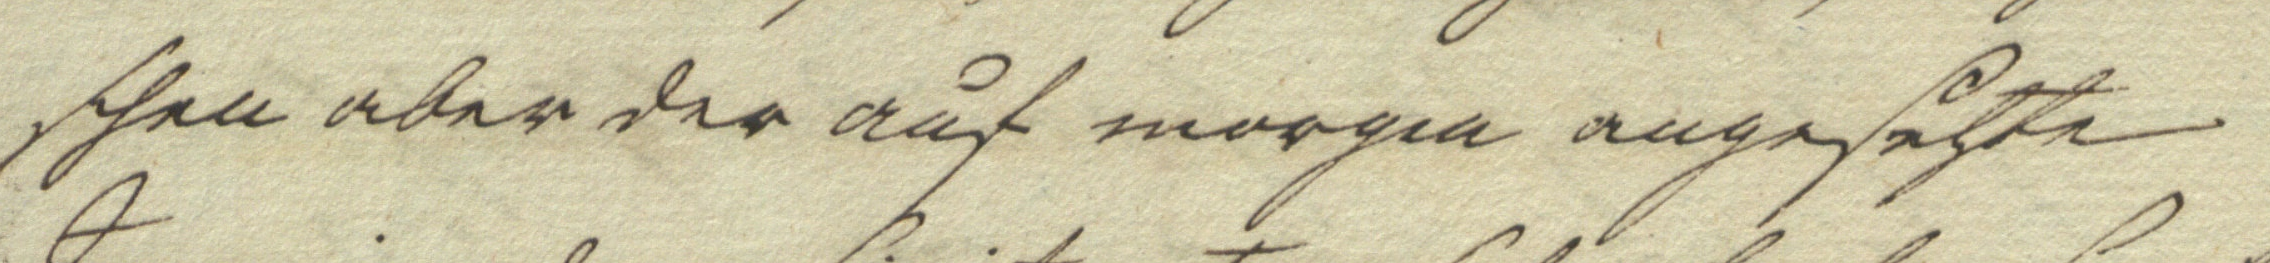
schen aber der auf morgen angesetzte
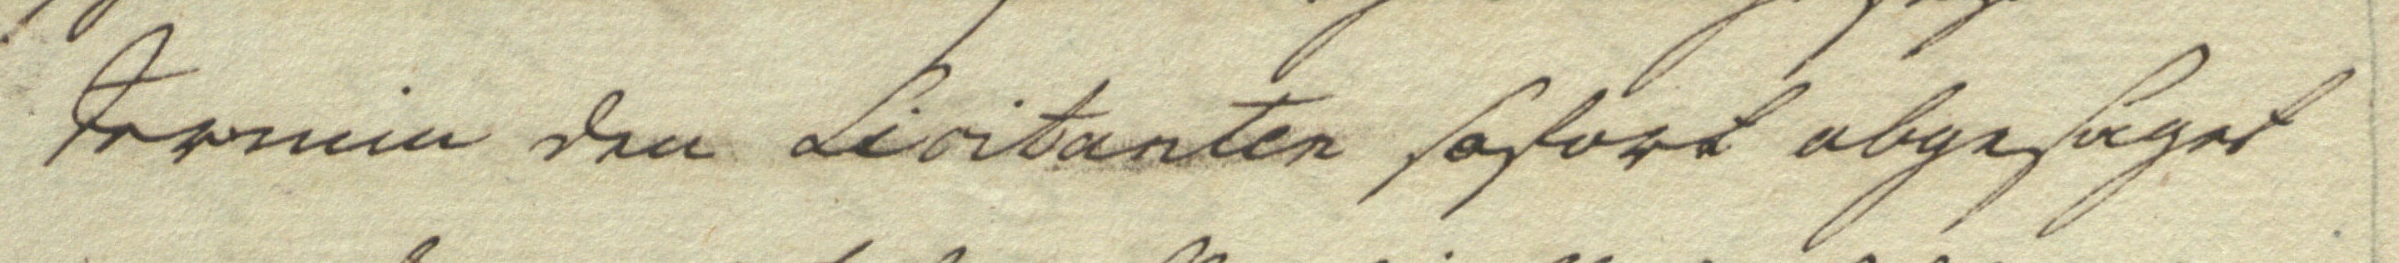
Termin den Licitanten sofort abgesaget
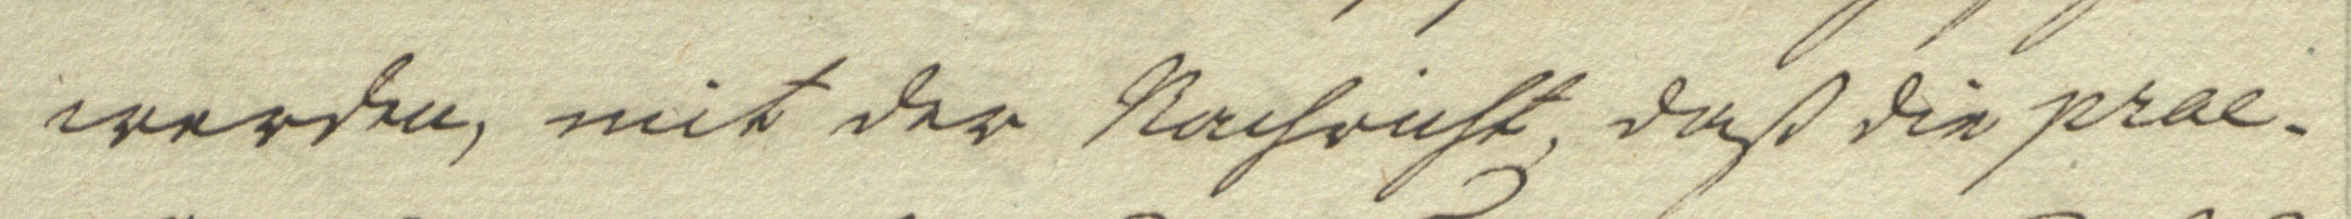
werden, mit der Nachricht daß die prae¬
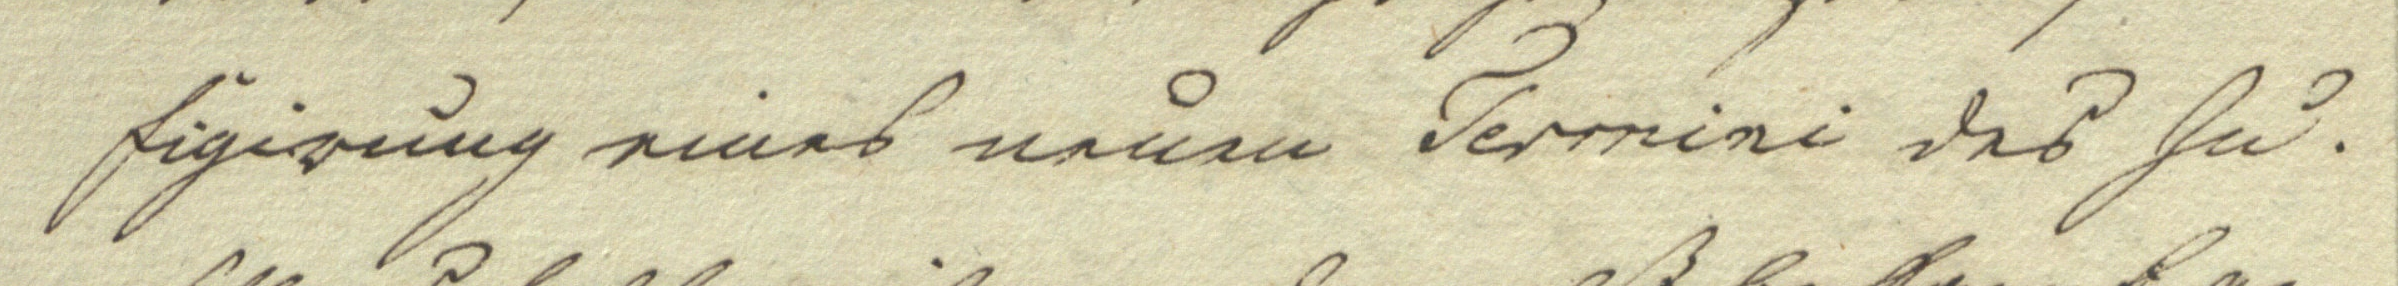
figirung eines neuen Termini des Zu¬
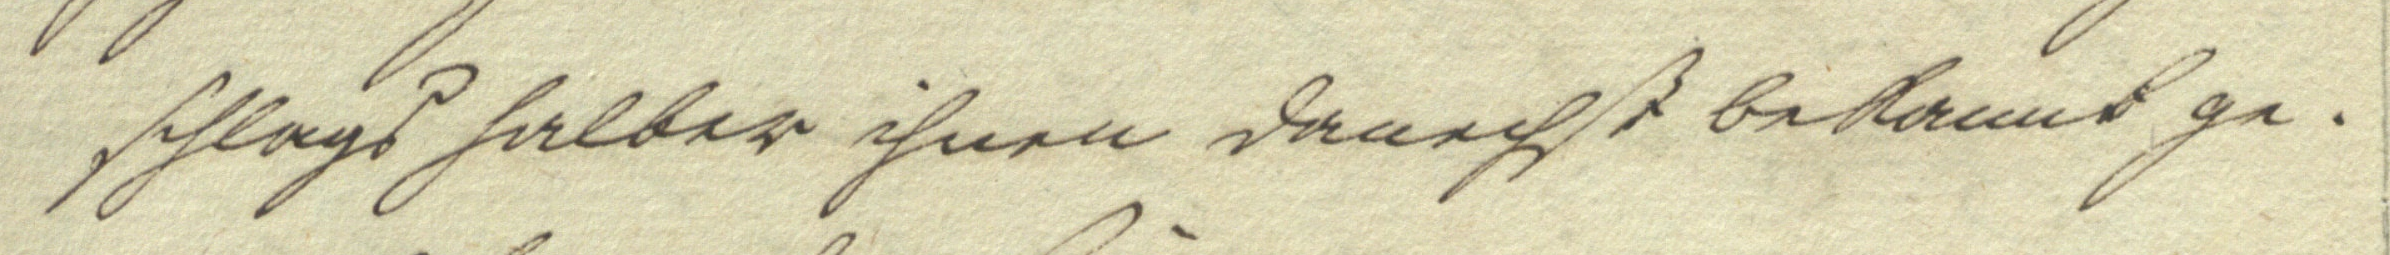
schlags halber ihnen danechst bekannt ge¬
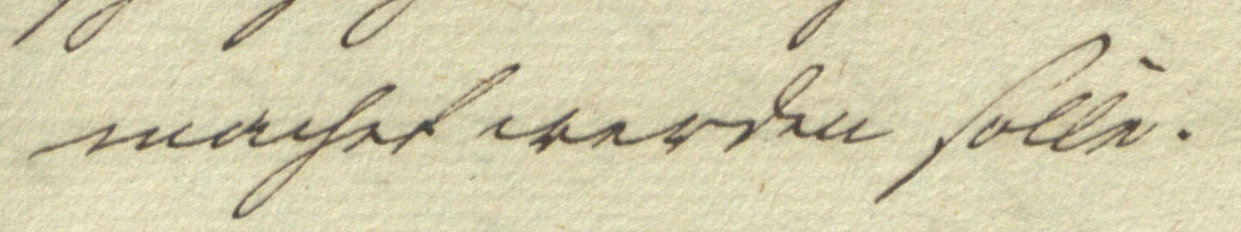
machet werden solle.
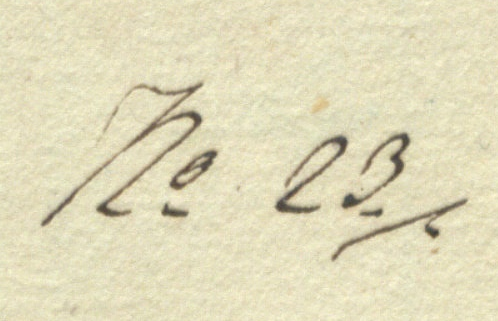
No 23.
